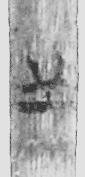{廿一}
